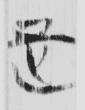是
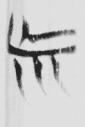巟
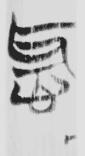怠
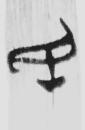民
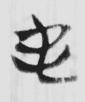屯
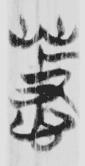{艸攴心}
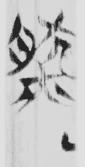然
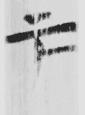下
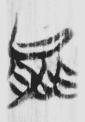能
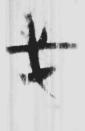弋
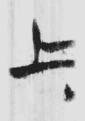上
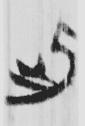此
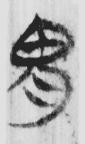胃
